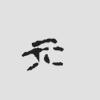亓（其）
